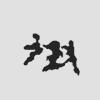旬
